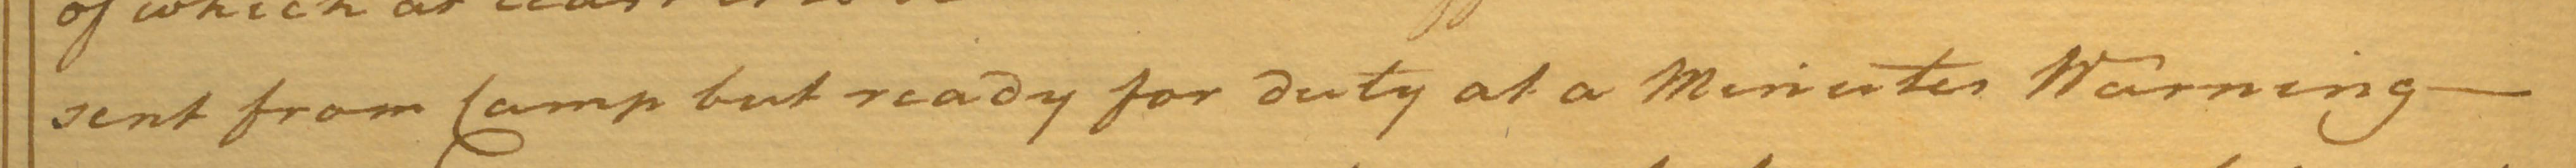sent from Camp but ready for duty at a Minutes Warning-
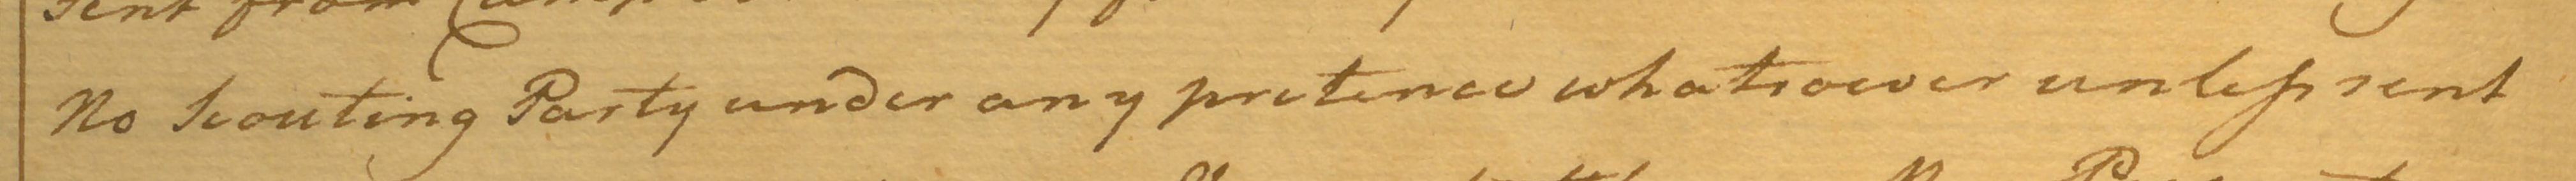No Scouting Party under any pretence whatsoever unless sent
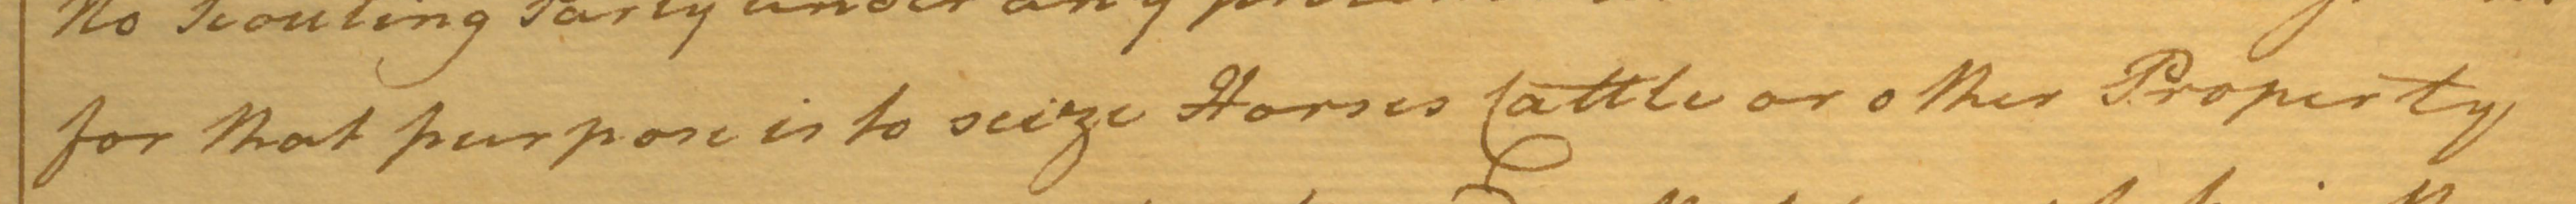for that purpose is to seize Horses Cattle or other Property
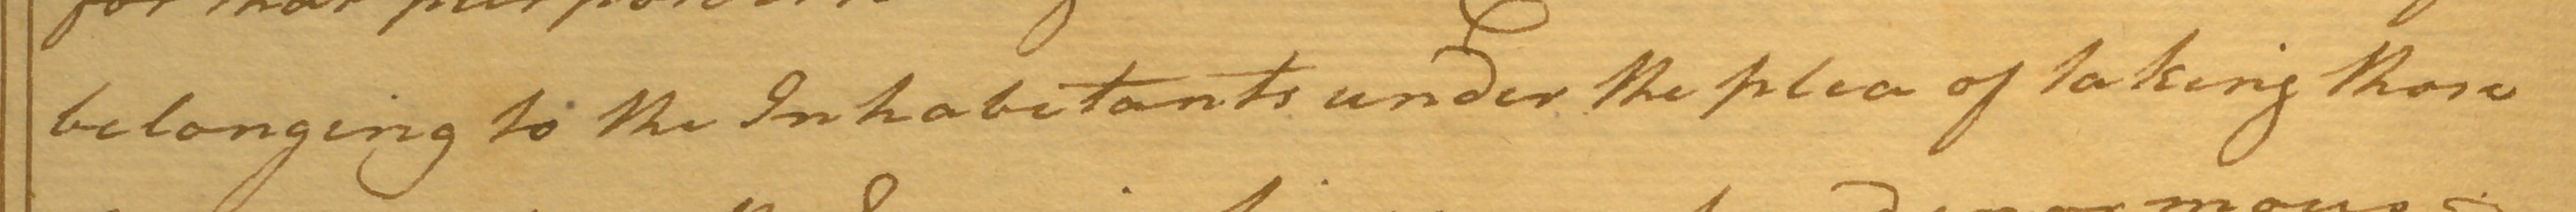belonging to the Inhabitants under the the plea of taking those
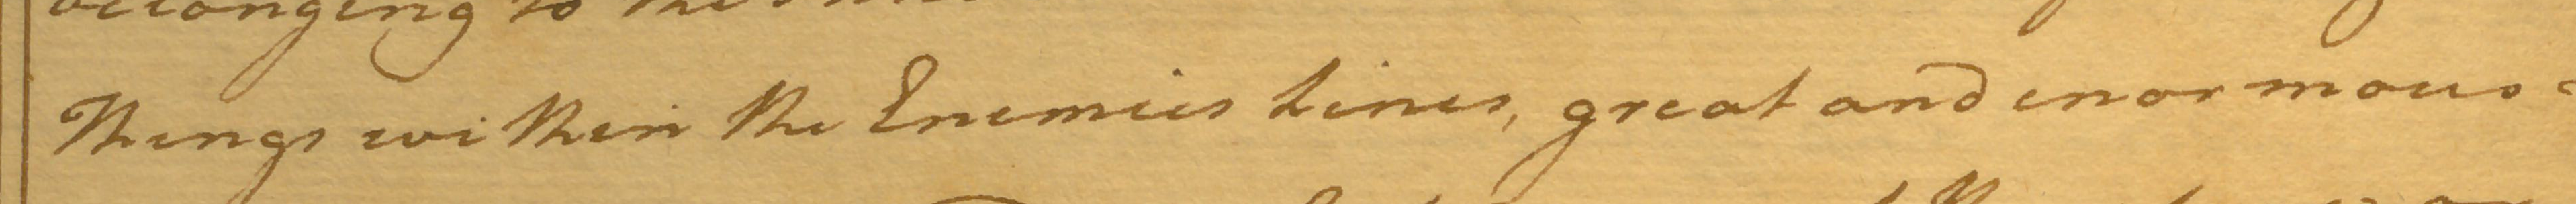Things within the Enemies Lines, great and enormous
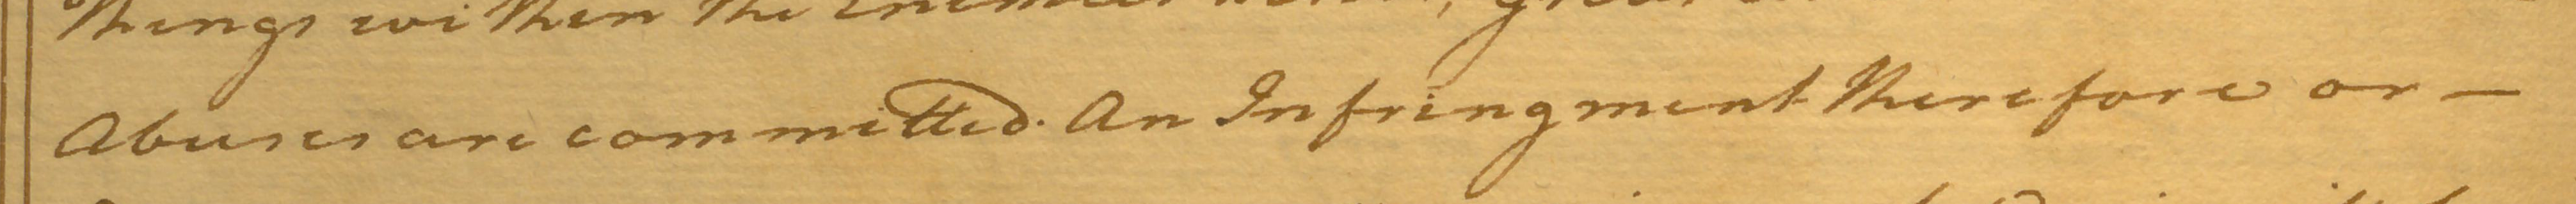Abuses are committed. An Infringment therefore or-
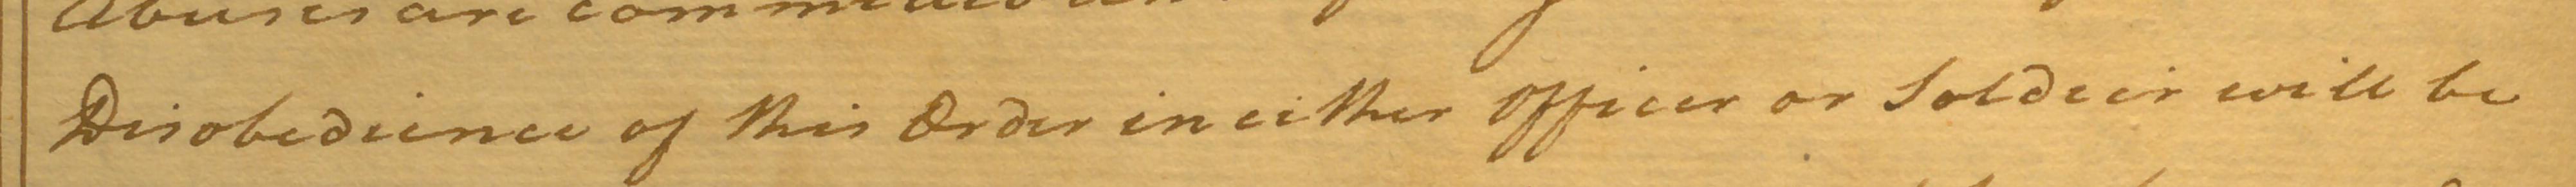Disobedience of this order in either Officer or Soldier will be
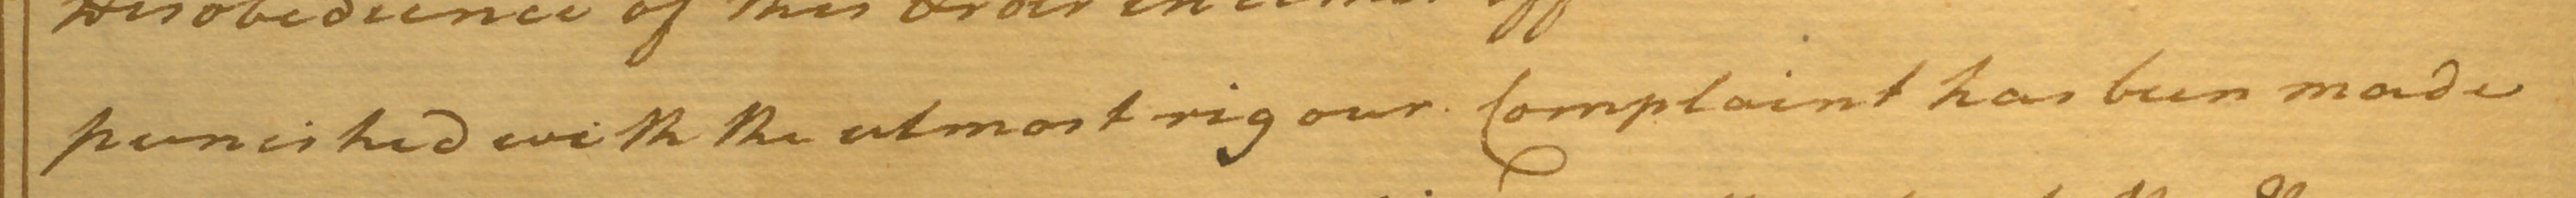punished with the utmost rigour. Complaint has been made
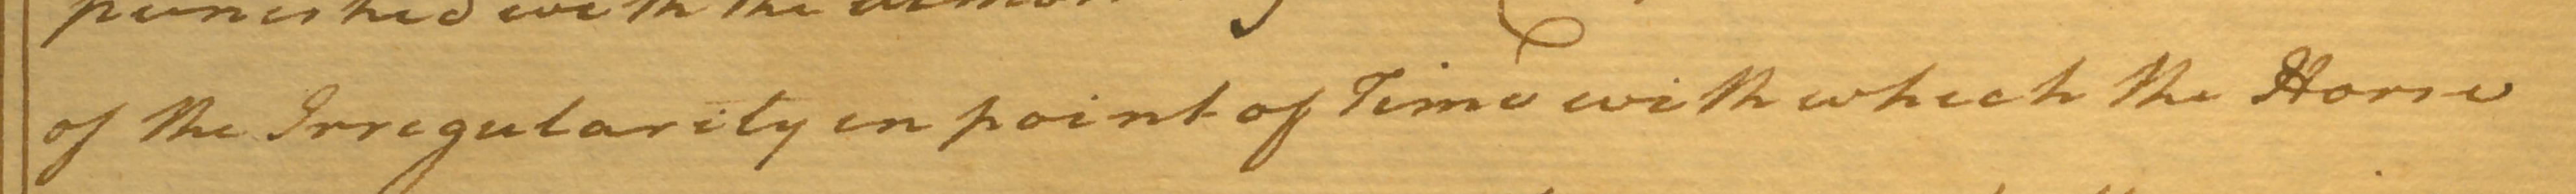of the Irregularity in point of Time with which the Horse
